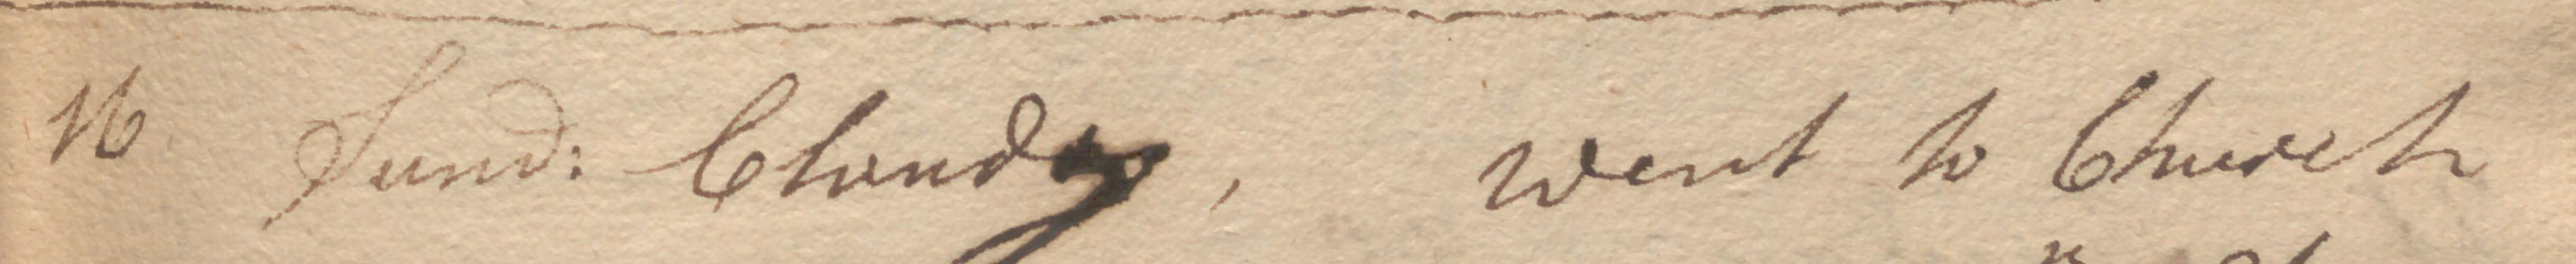16 Sund: Cloudy, went to Church
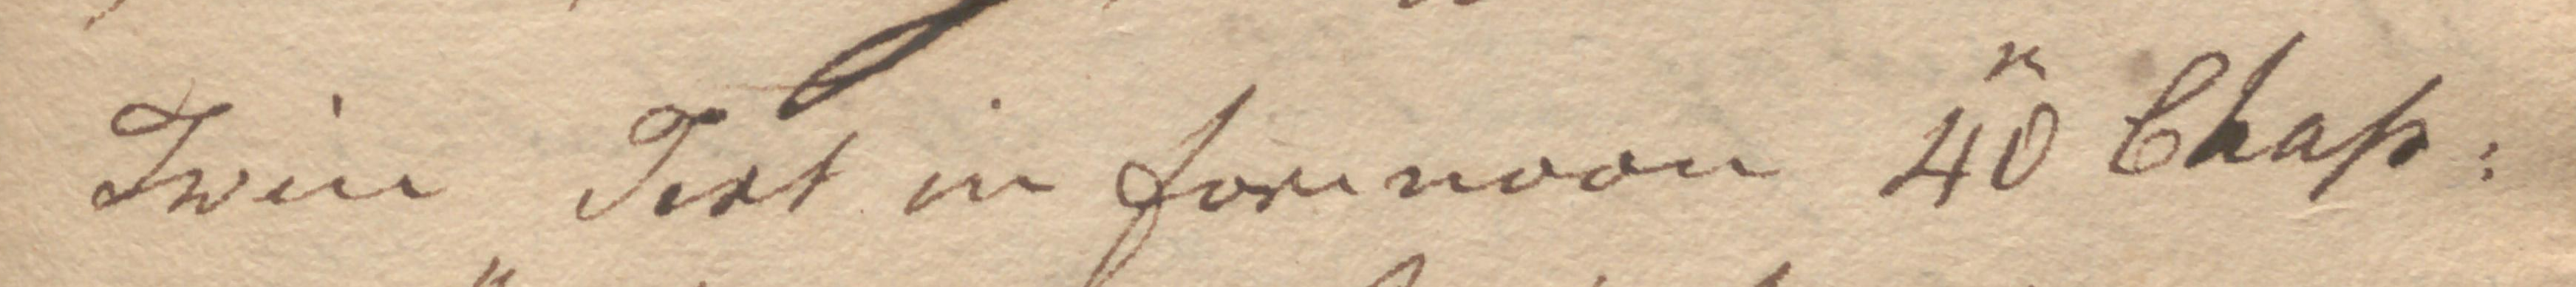Twice Text in forenoon 40^th Chap:
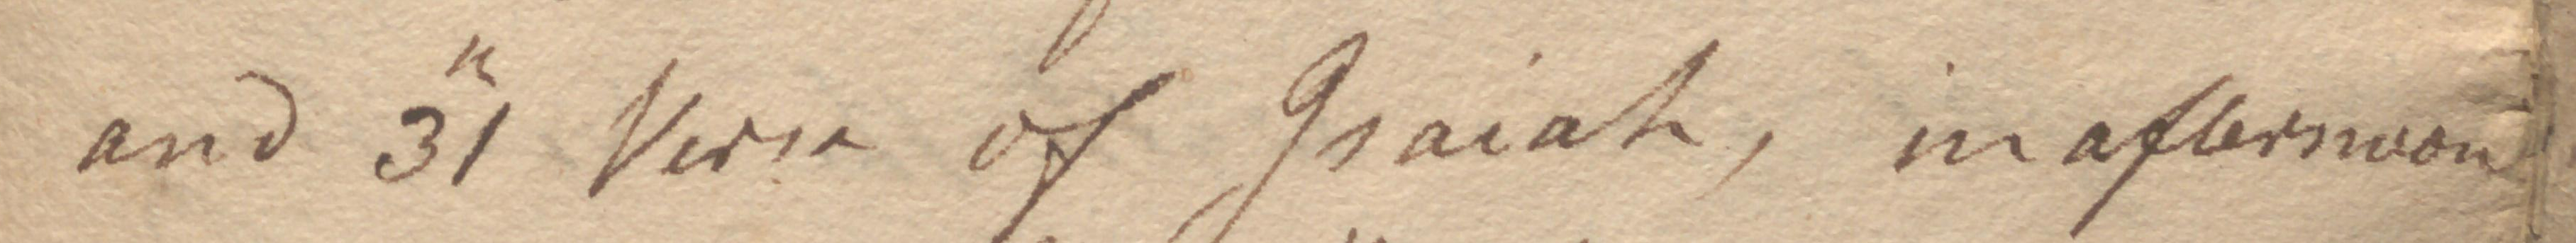and 31^th Verse of Isaiah, in afternoon
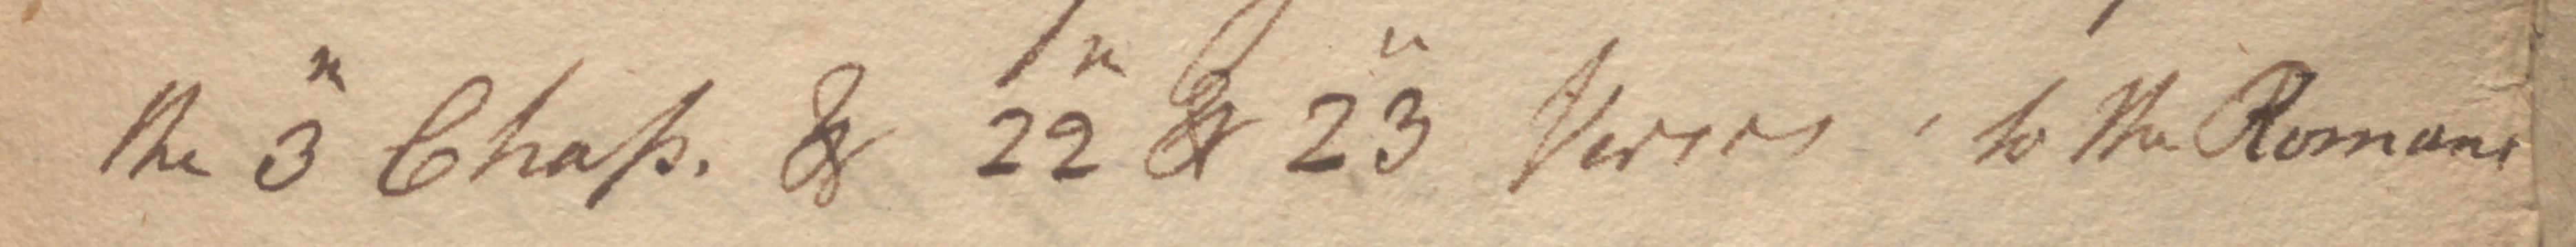the 3^th Chap. & 22^th & 23^th Verses to the Romans
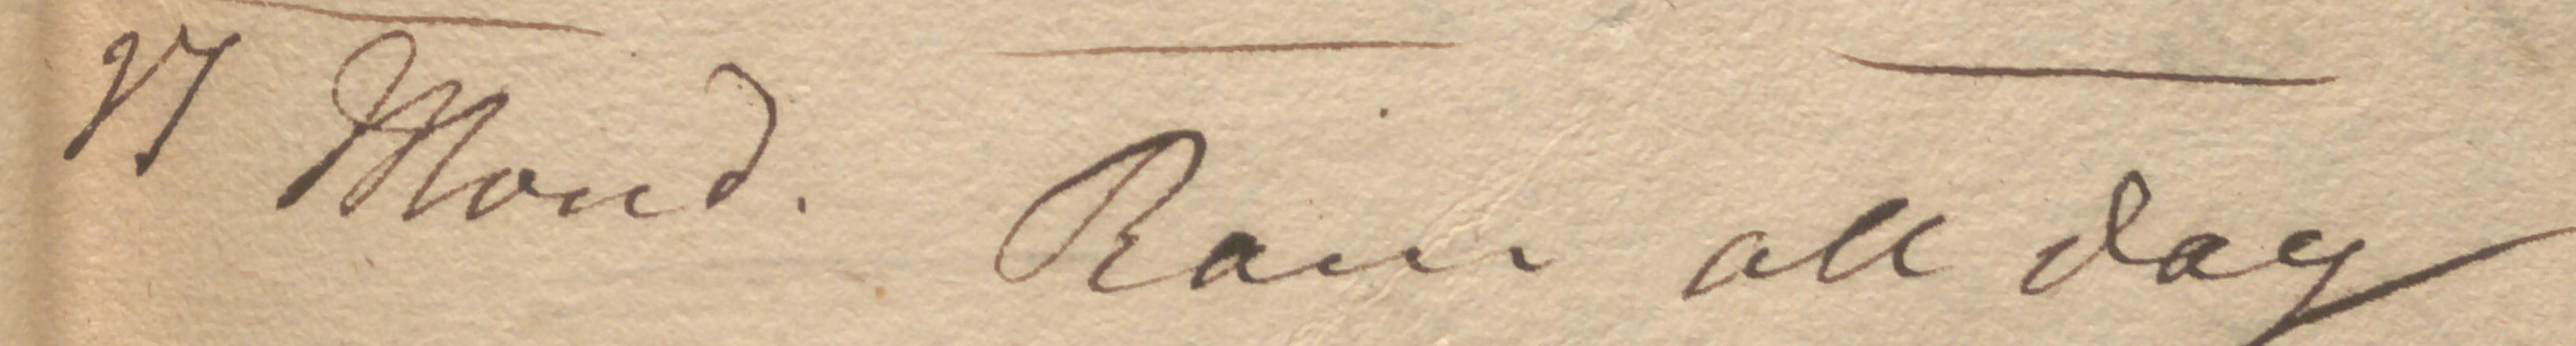17 Mond. Rain all day
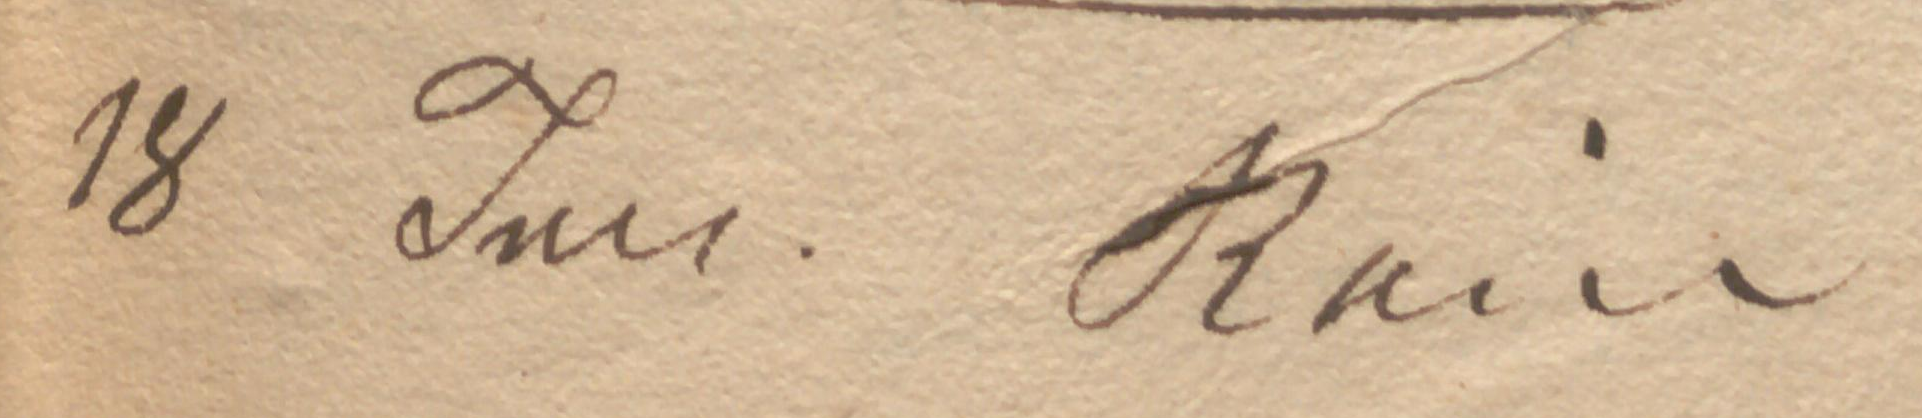18 Tues. Rain
